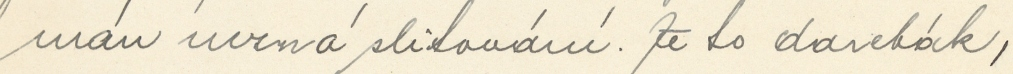mán nezná slitování. Je to darebák,
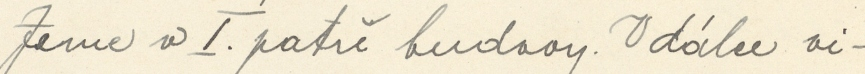Jsme v I. patře budovy. V dálce vi-
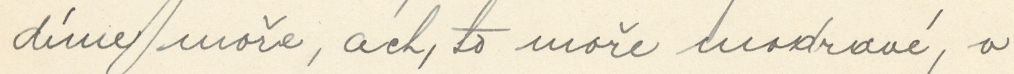díme moře, ach, to moře modravé, v
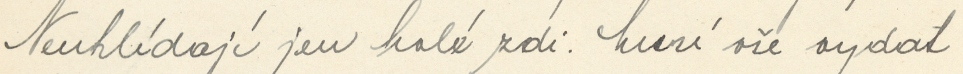Neuhlídají jen holé zdi. Musí vše vydat.
